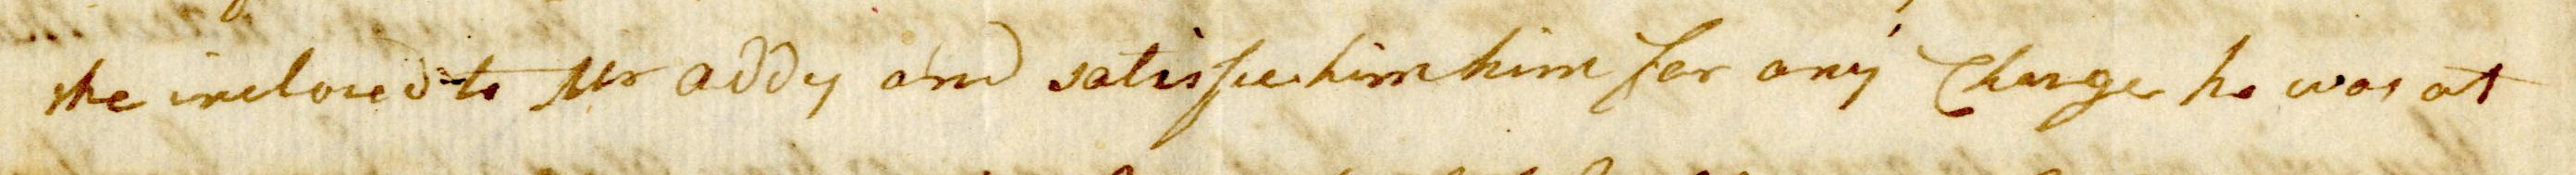the inclosed to M^r Addy and satisfie him him for any Charge he was at
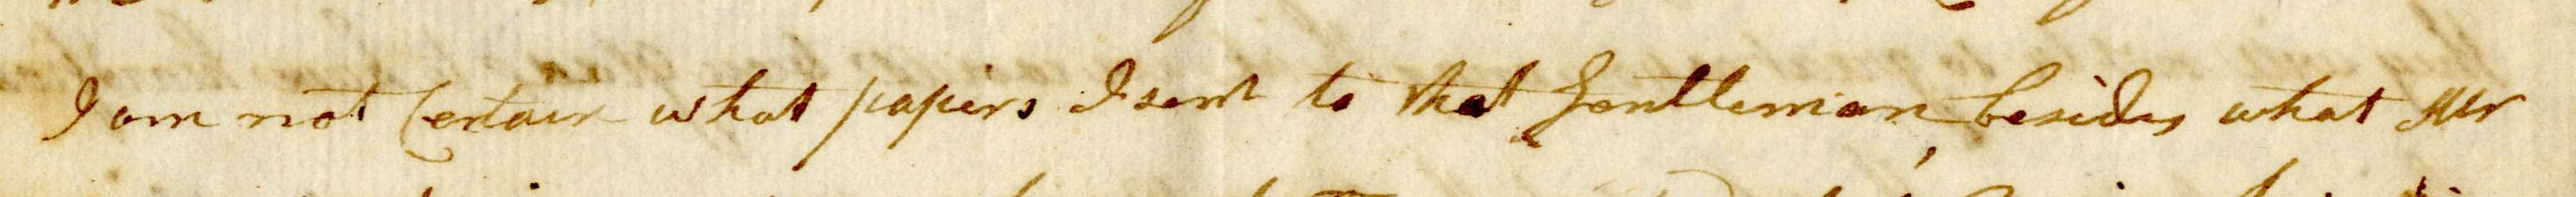I am not Certain what papers I sent to that Gentleman besides what M^r
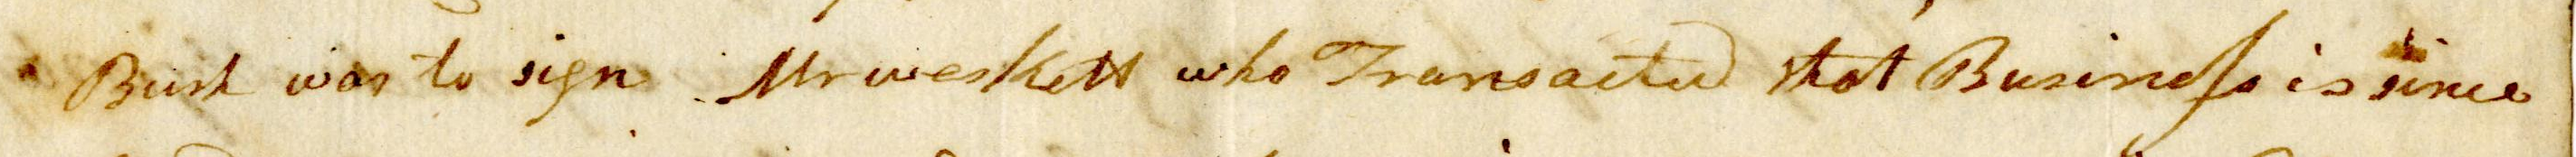Bush was to sign Mr Weskett who Transacted that Business is since
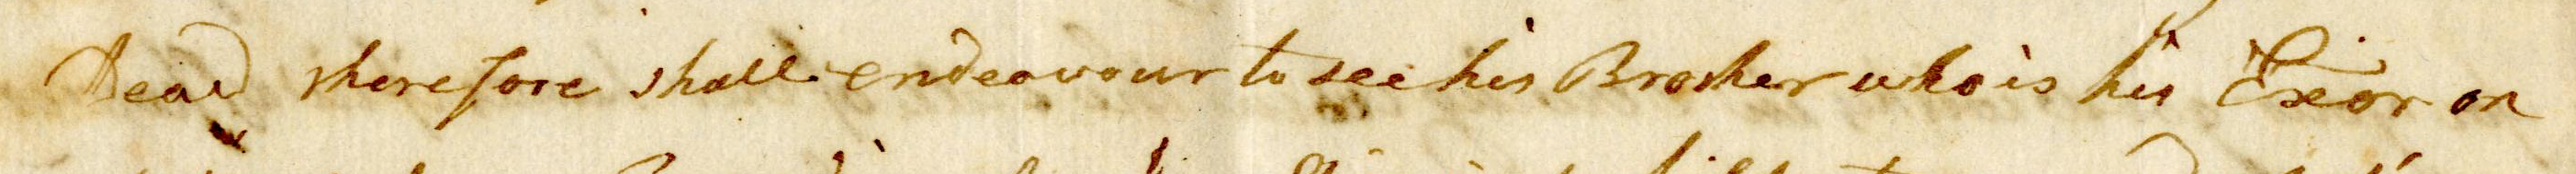Dead, therefore shall endeavor to see his Brother who is his Exer on
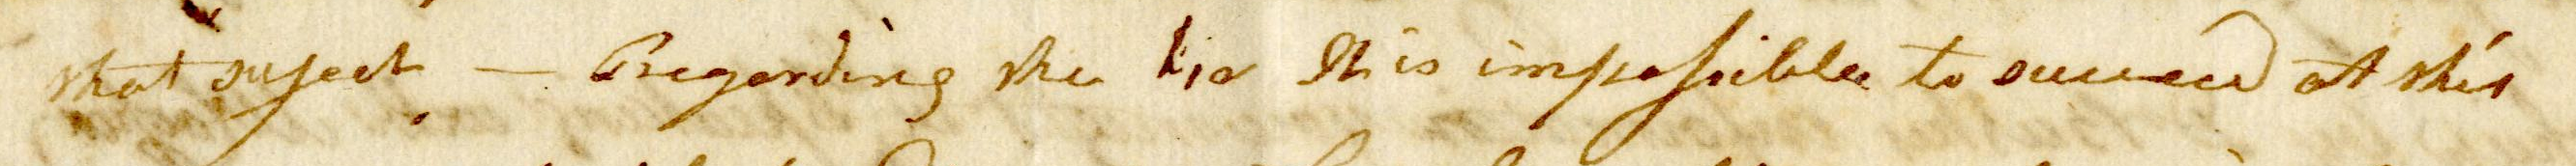that suject.- Regarding ther [___] It is impossible to succeed at this
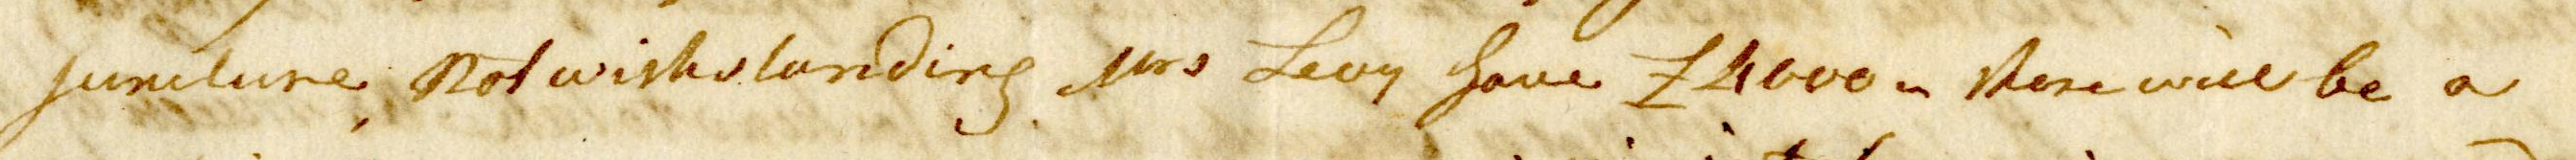Juncture Not withstanding Mrs Levy gave £4000- there will be a
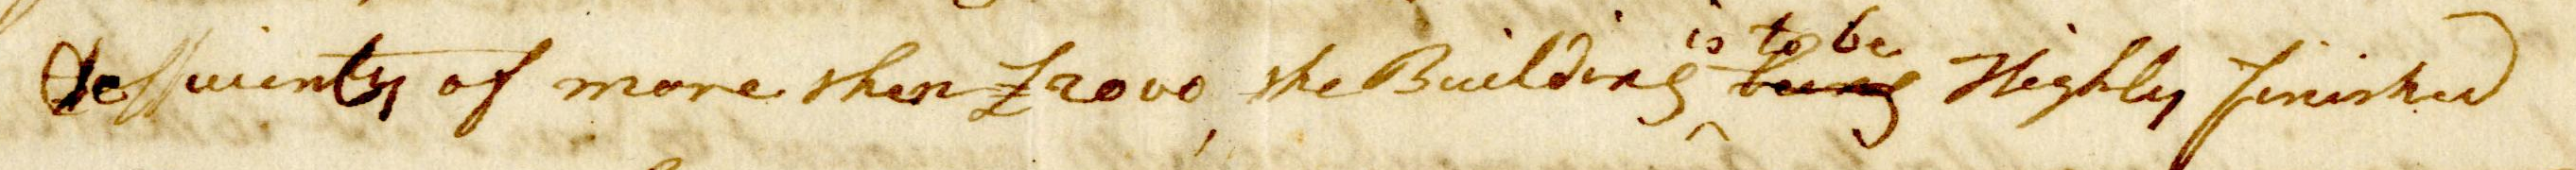Deficienty of more then £2000 the Building ^ [being] nighly finished
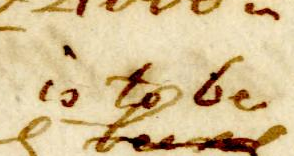is to be
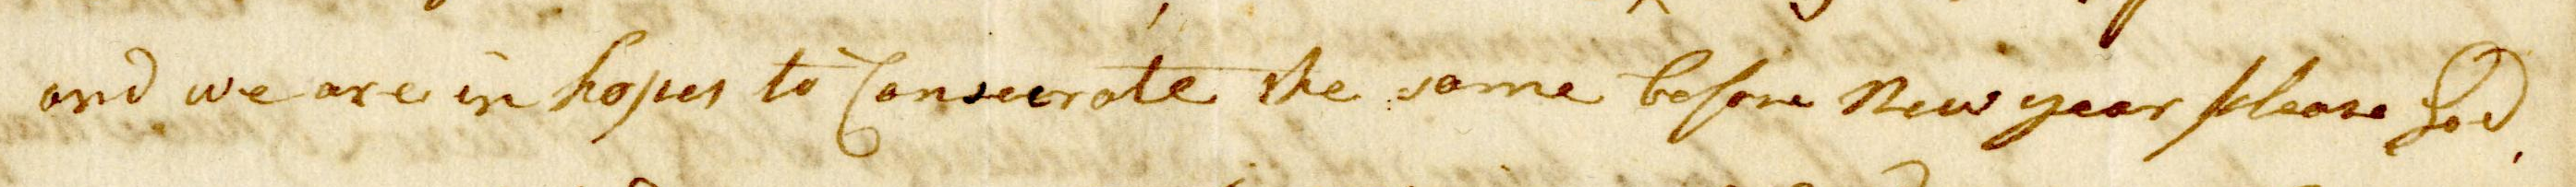and we are in hopes to Consecrate the some before New Year please God
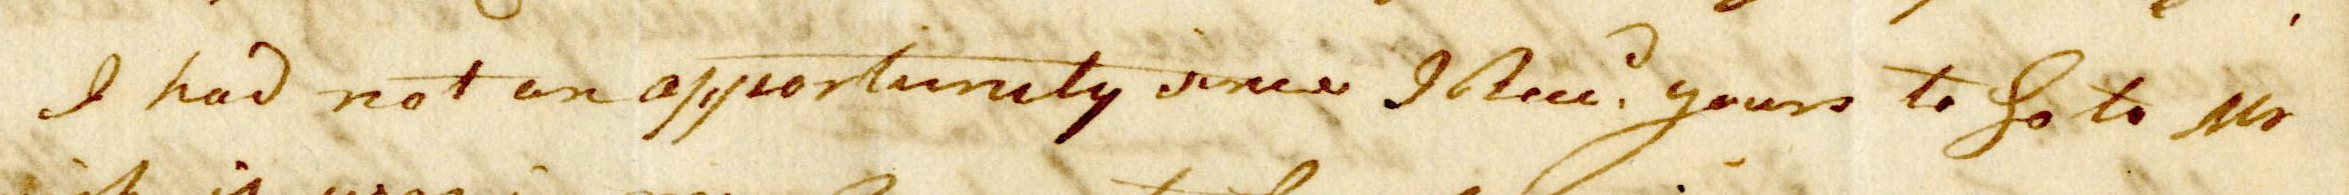I had not an opportunity since I Rece^d. yours to go to Mr
